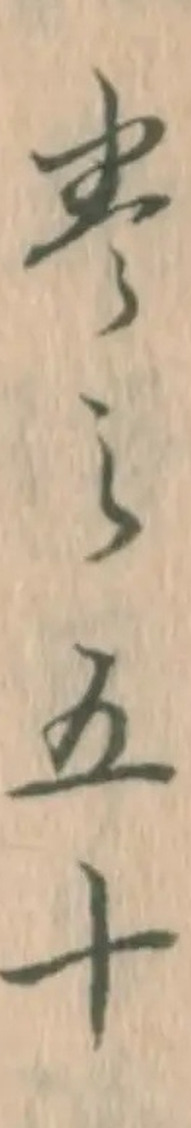巻之五十

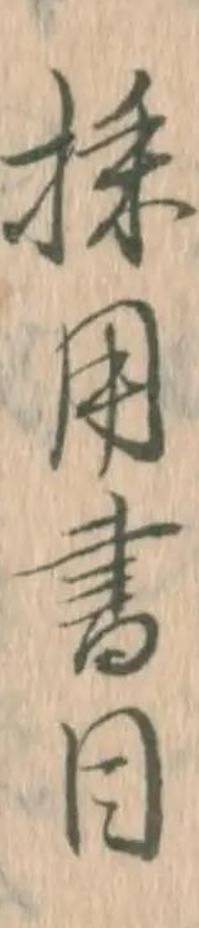採用書目
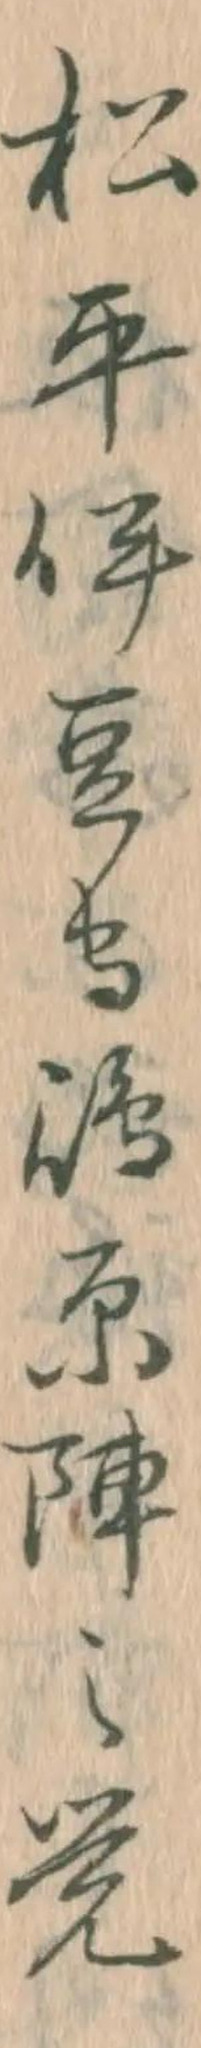松平伊豆守島原陣之覚
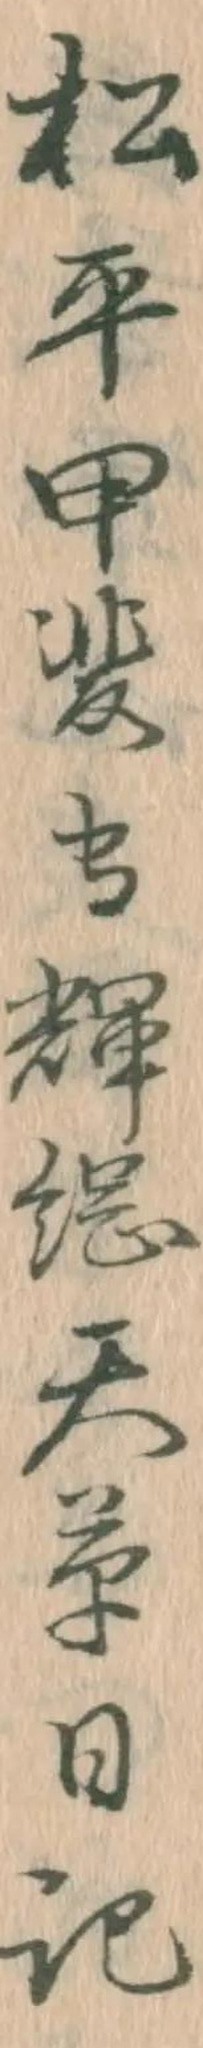松平甲斐守輝綱天草日記
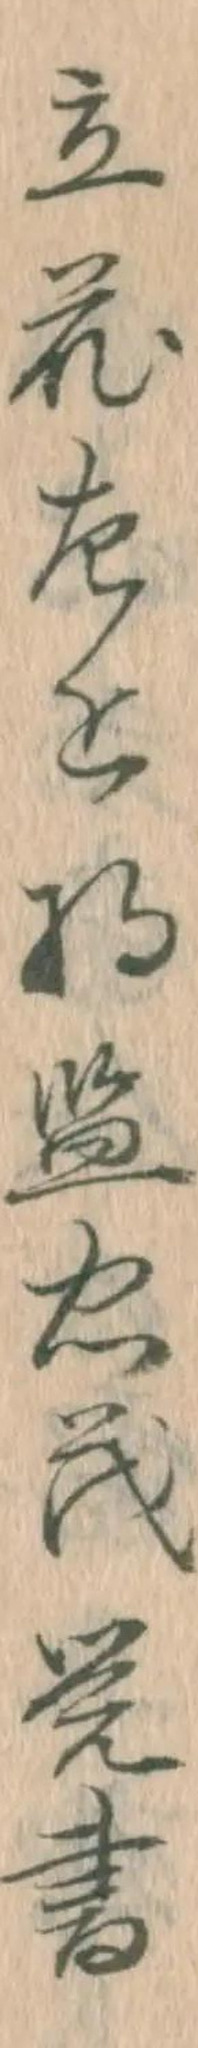立花左近将監忠茂覚書
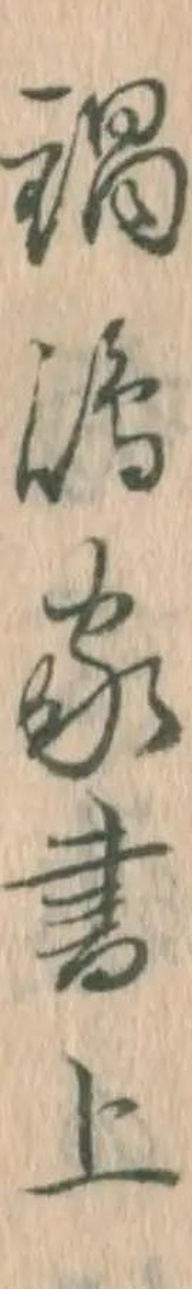鍋島家書上
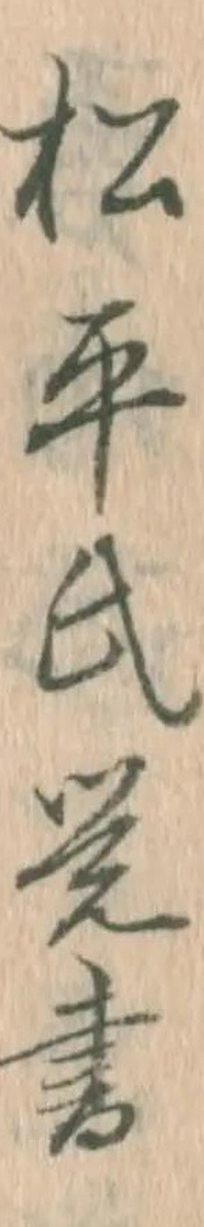松平氏覚書
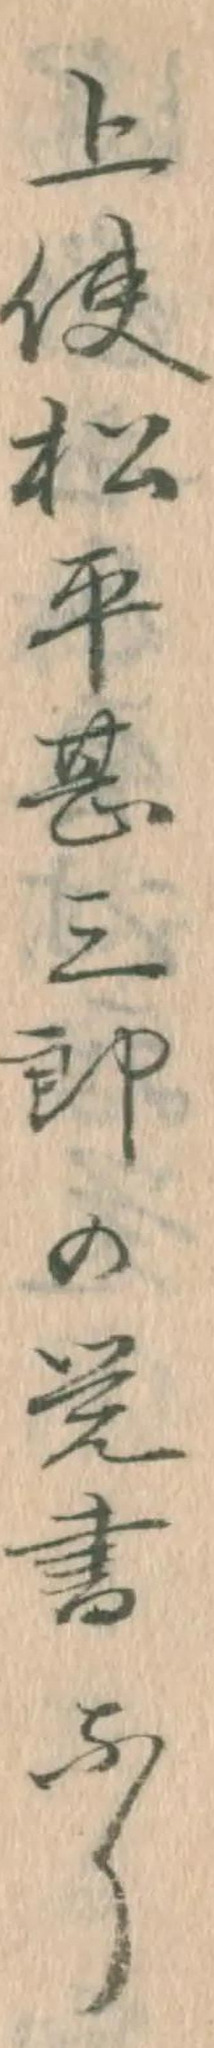上使松平甚三郎の覚書なり
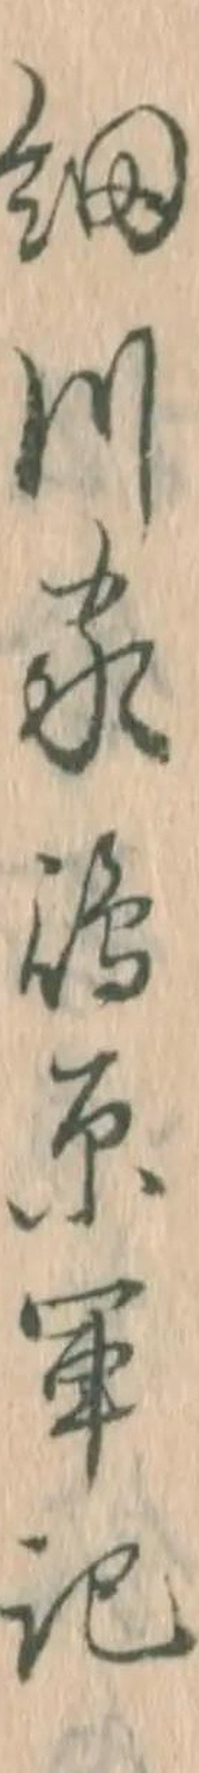細川家島原軍記
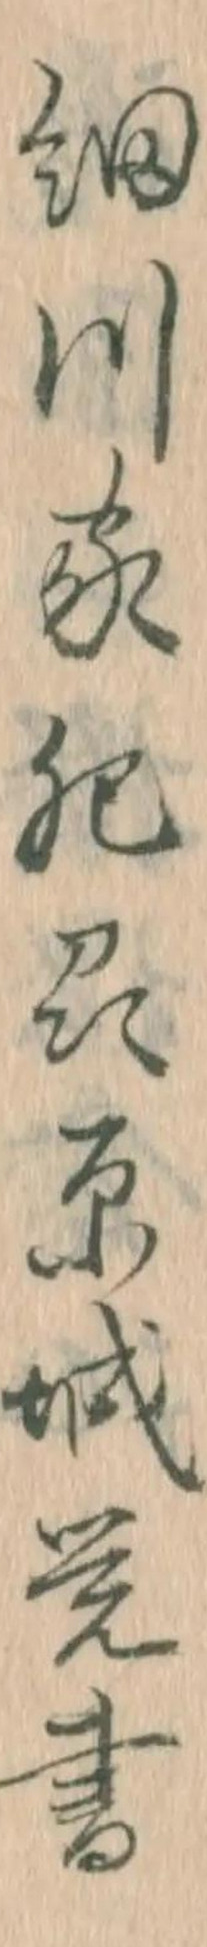細川家肥州原城覚書

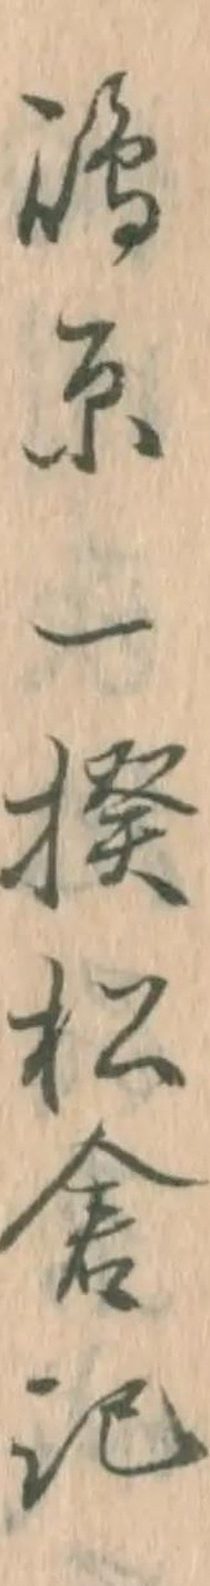島原一揆松倉記
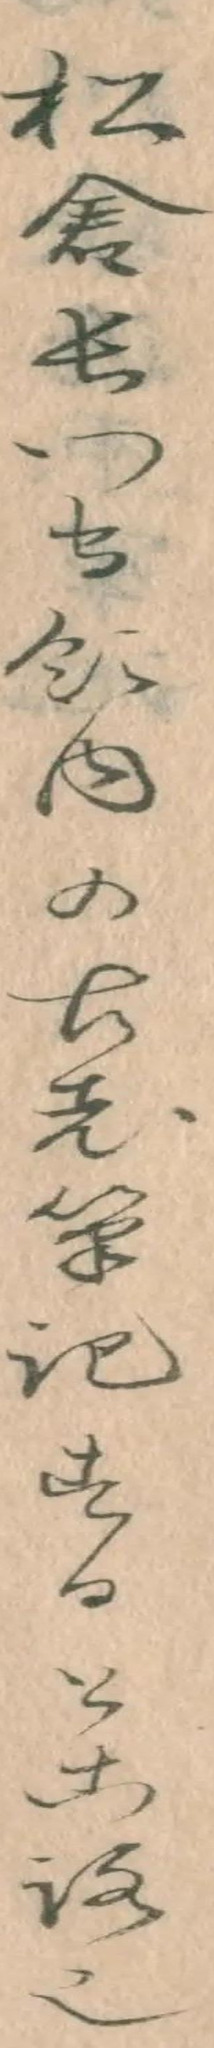松倉長門守領内の古老筆記するところ也
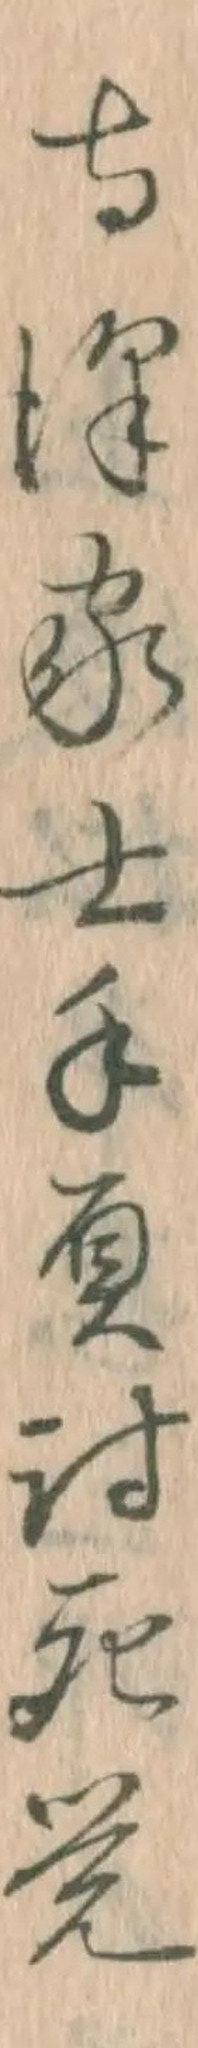寺沢家士手負討死覚
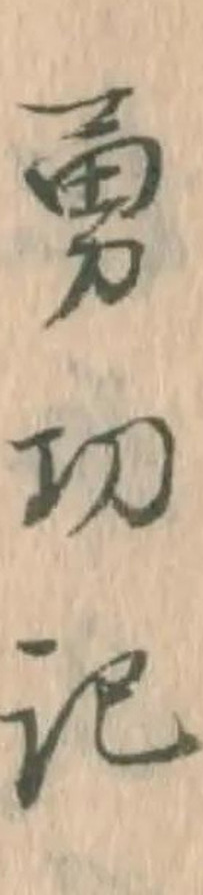勇功記
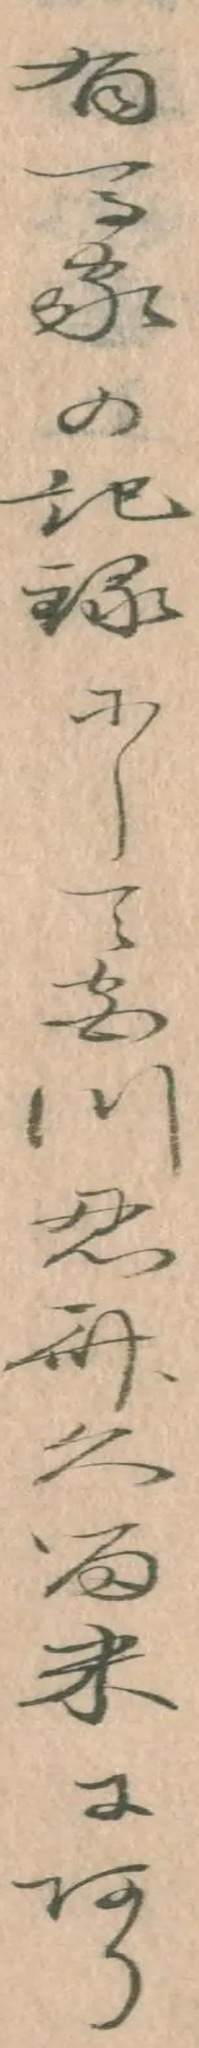有馬家の記録にして宮川忍斎久留米にあり
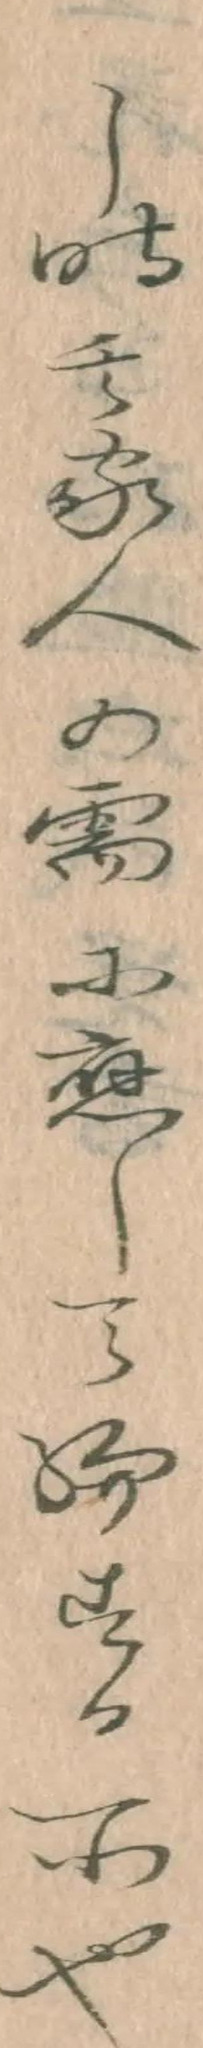し時其家人の需に応して編する所也
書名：切支丹御退治記 49巻. [1]
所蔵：国立国会図書館 National Diet Library, JAPAN
